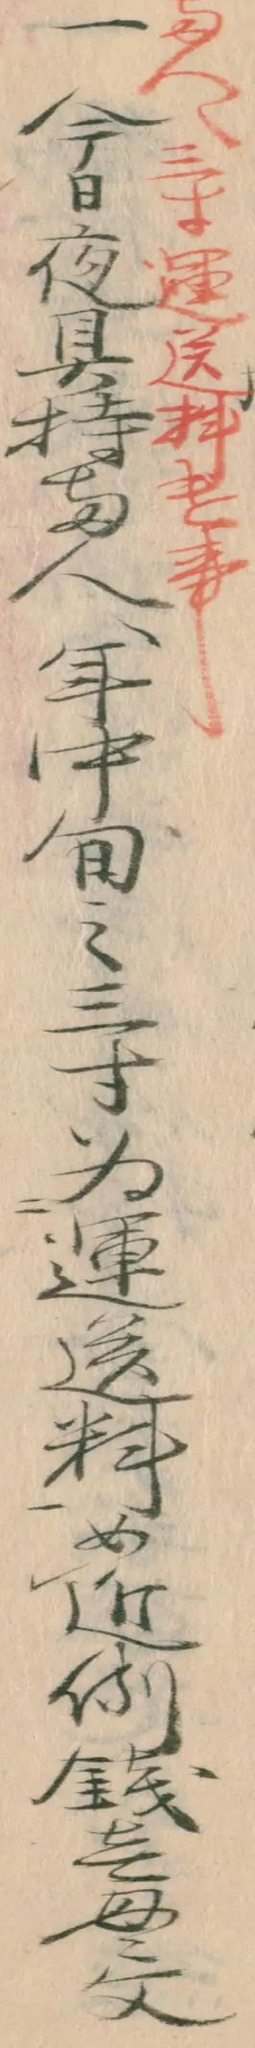一今日夜具持両人へ年中旬之三寸為運送料如近例銭壱貫文
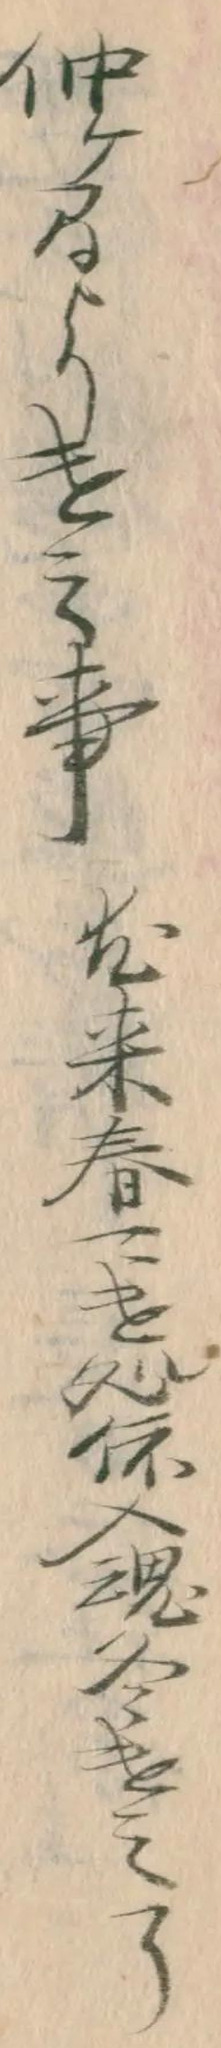仲ケ間より遣之事尤来春可遣処依入魂冬遣之了
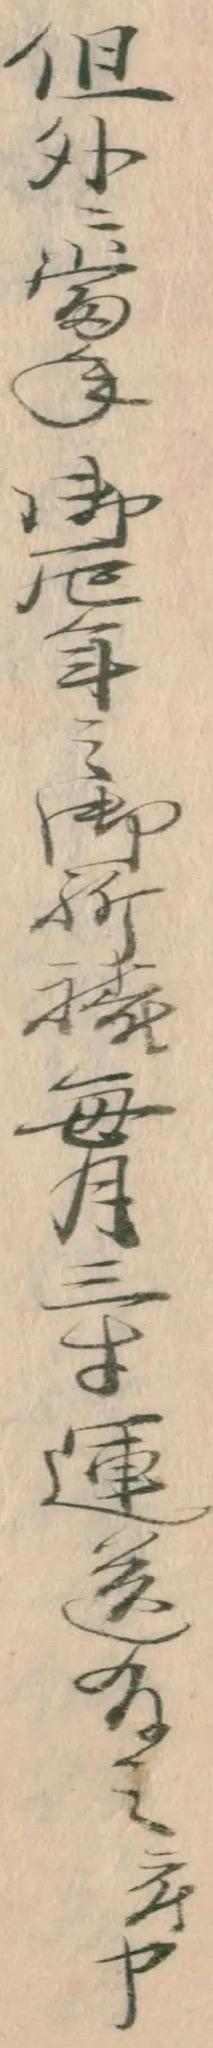但外ニ當年御厄年之御祈祷毎月三寸運送有之ニ付申
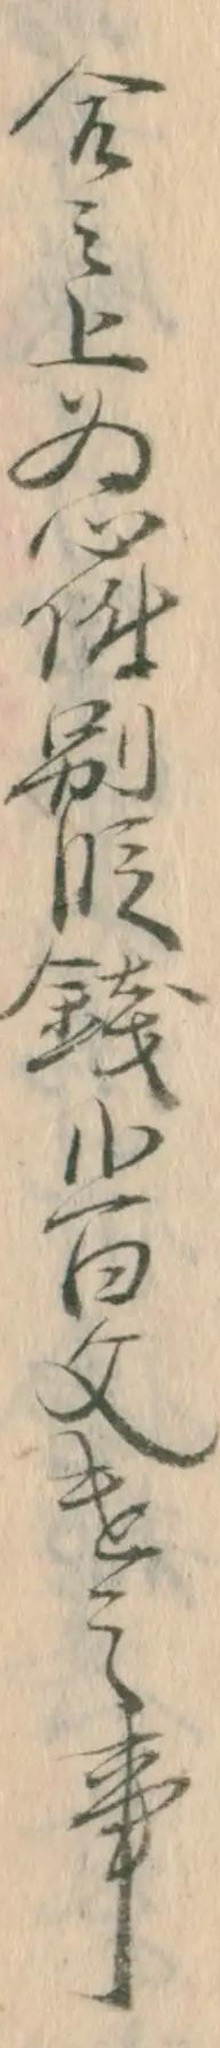合之上為心附別段銭弐百文遣之事

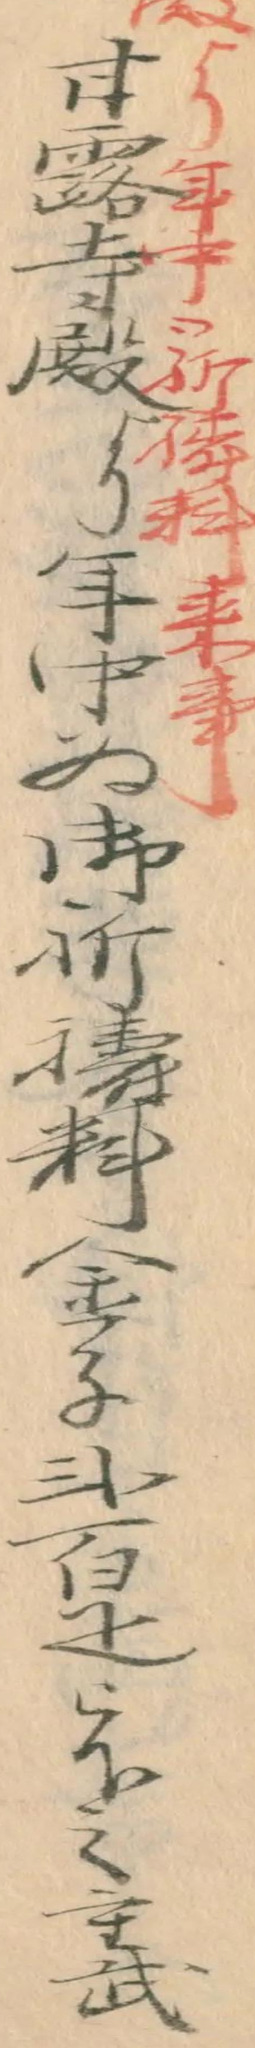一甘露寺殿より年中為御祈祷料金子弐百疋被下之重武
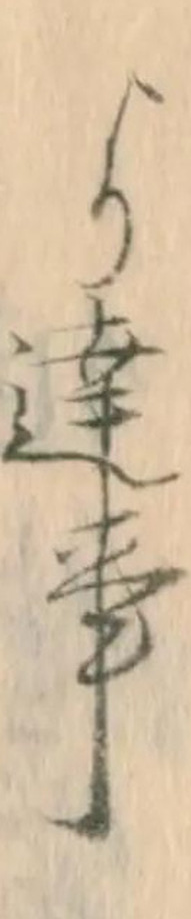より達事
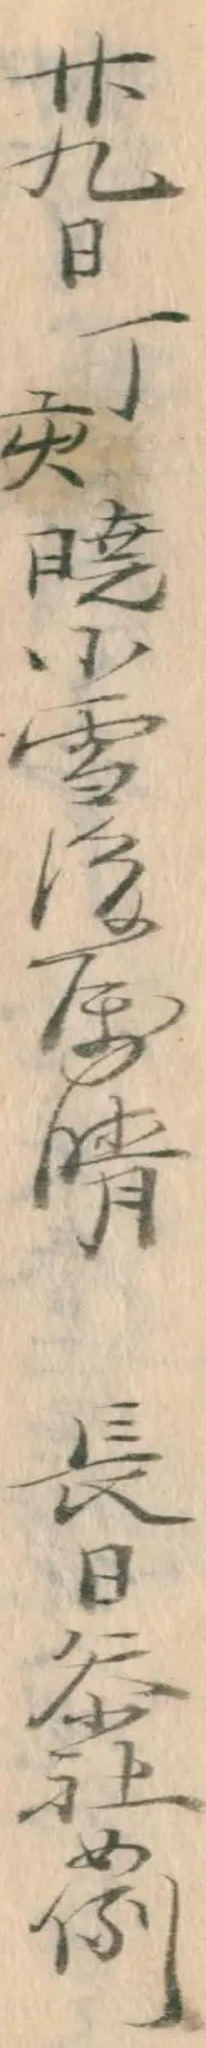廿九日丁亥暁小雪後属晴長日参社如例
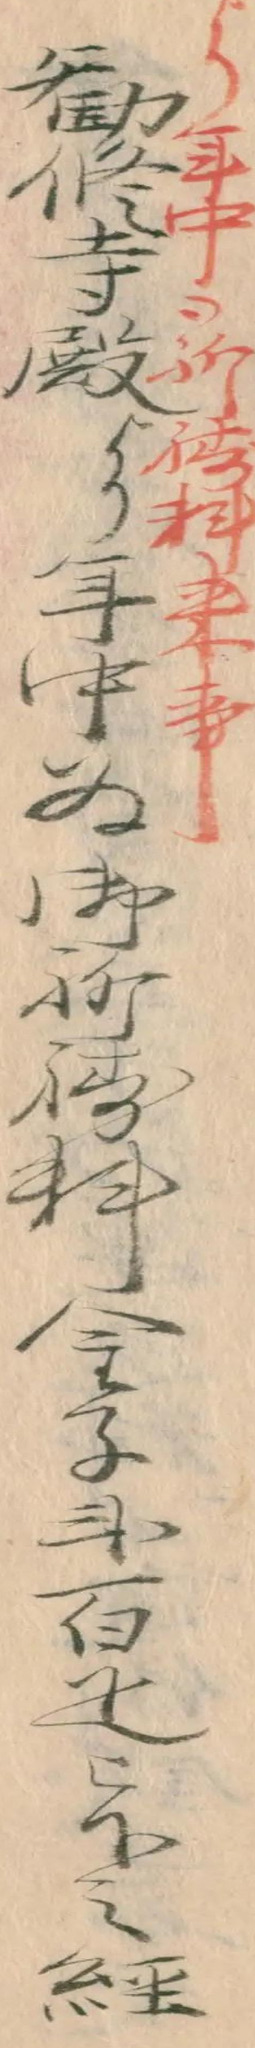勧修寺殿より年中為御祈祷料金子弐百疋被下之経
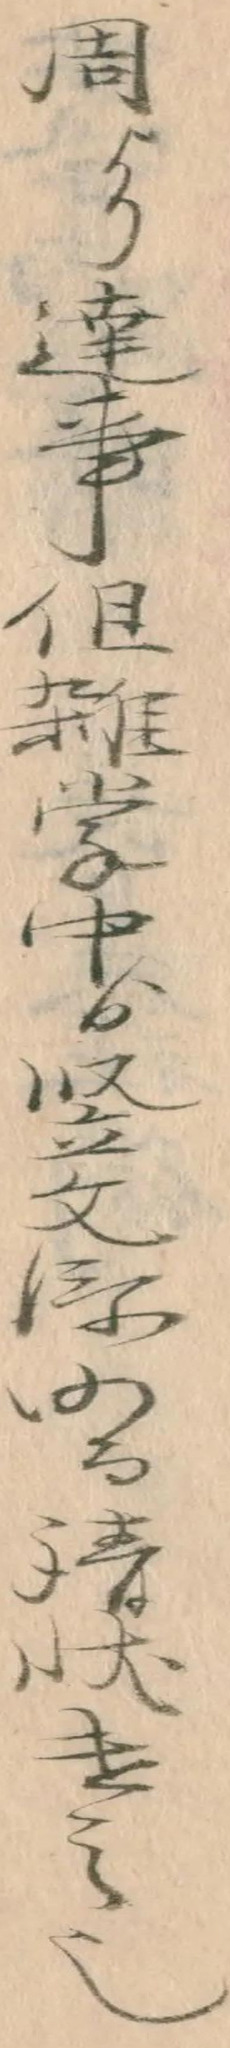周より達事但雑掌中ゟ竪文添仍而請状遣之也
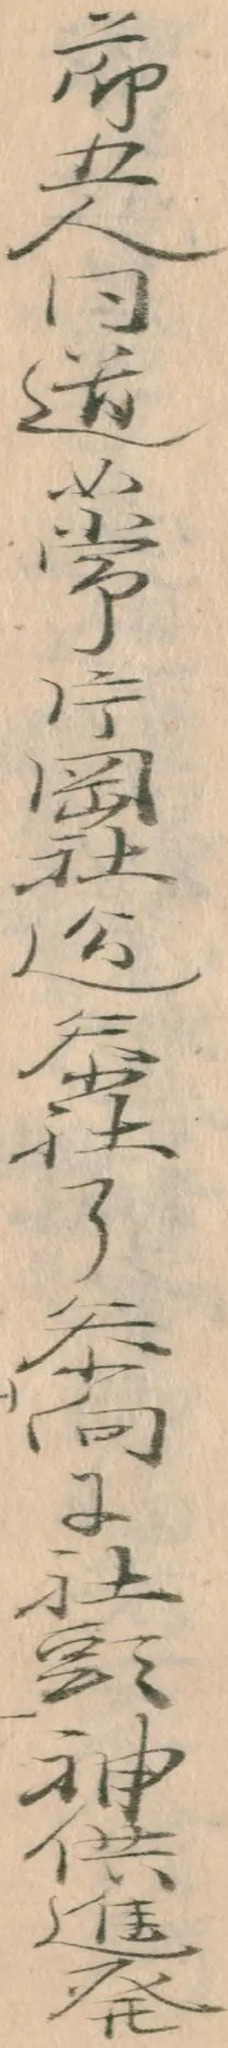節五人同道如常片岡社迄参社了参向于社頭神供進発
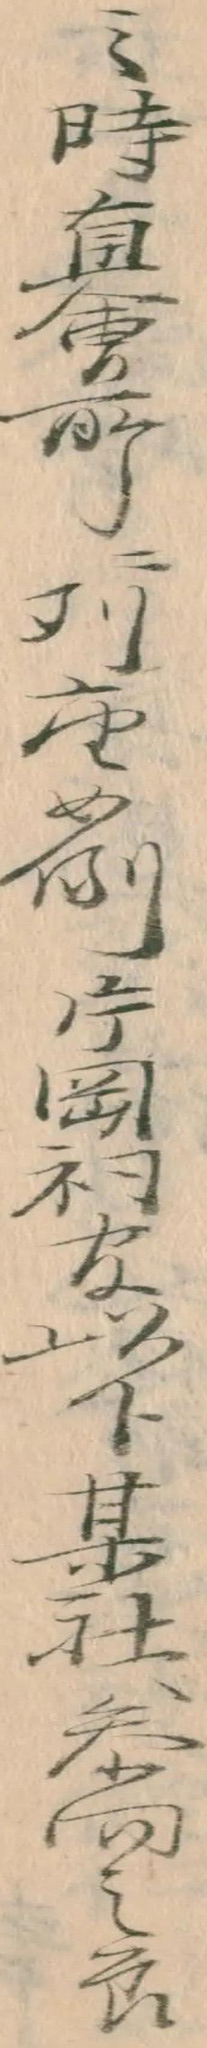之時直會所ニ列座如例片岡祠官以下某社へ参向之節
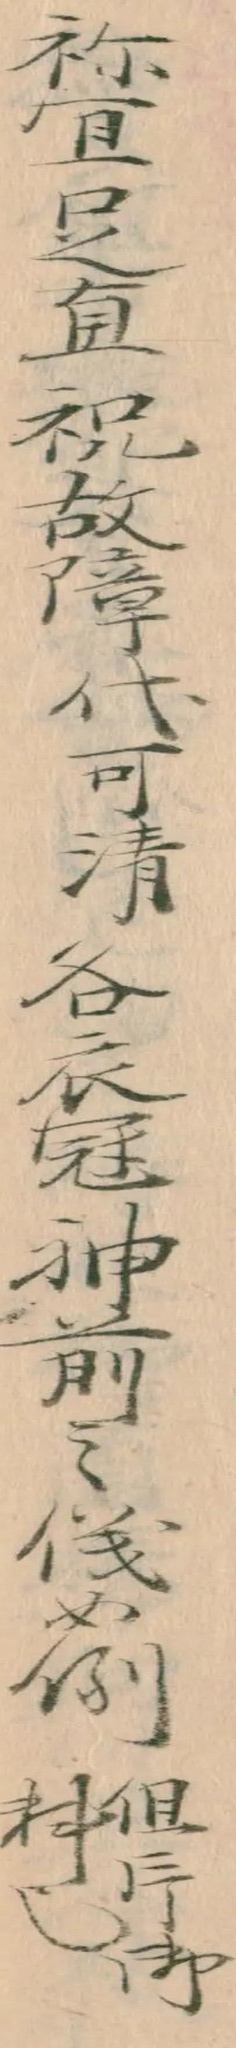称宜足直祝故障代可請各衣冠神前之儀如例但片御料也
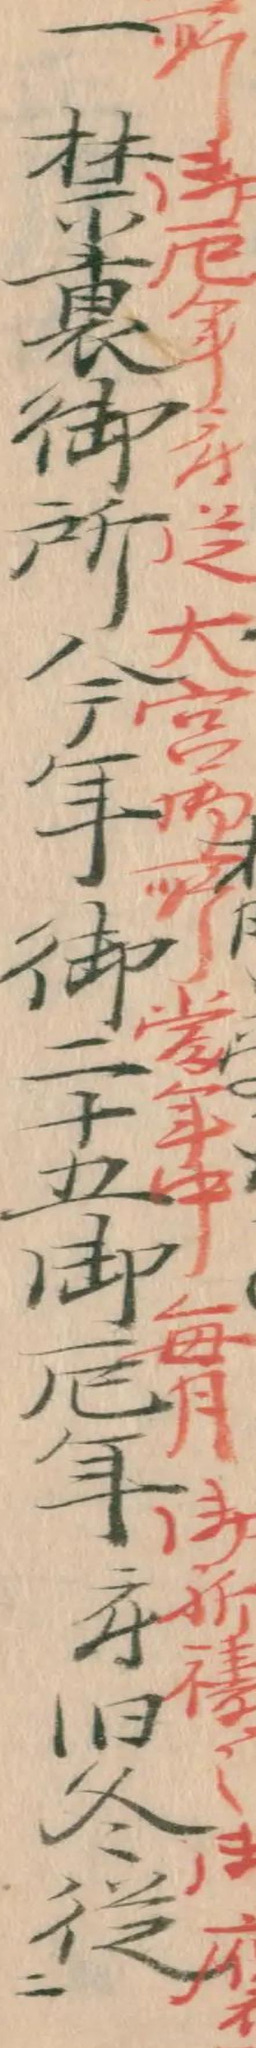禁裏御所今年御二十五御厄年ニ付旧冬従
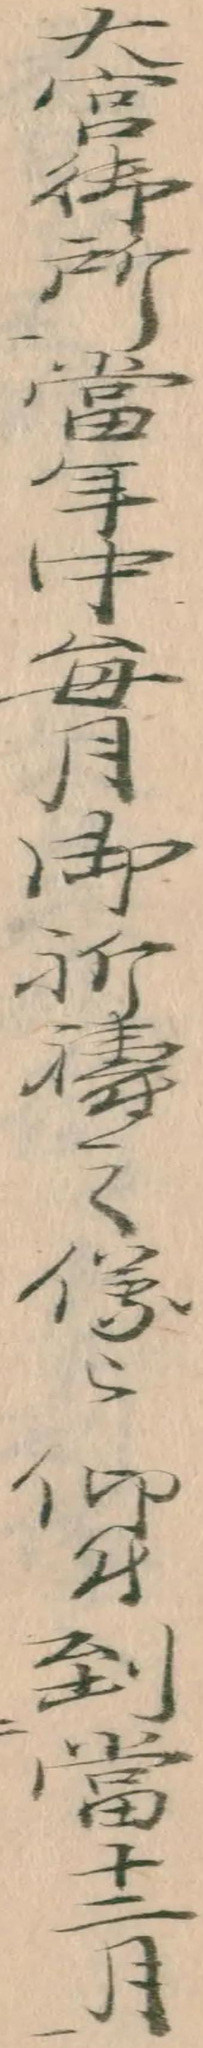大宮御所當年中毎月御祈祷之儀被仰付到當十二月
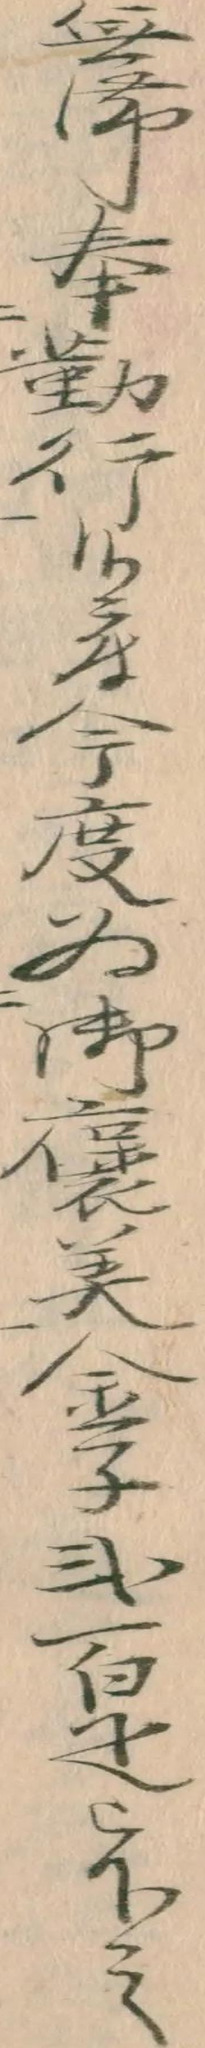無滞奉勤行候に付今度為御褒美金子弐百疋被下之
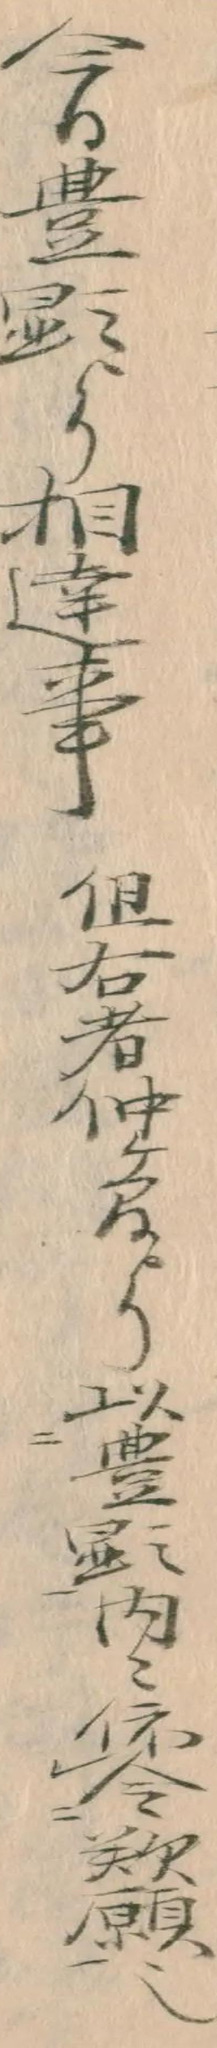今日豊頭より相達事但右者仲ケ間より以豊顕内々依令歎願也
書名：賀茂社記録. 第74冊
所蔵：国立国会図書館 National Diet Library, JAPAN
